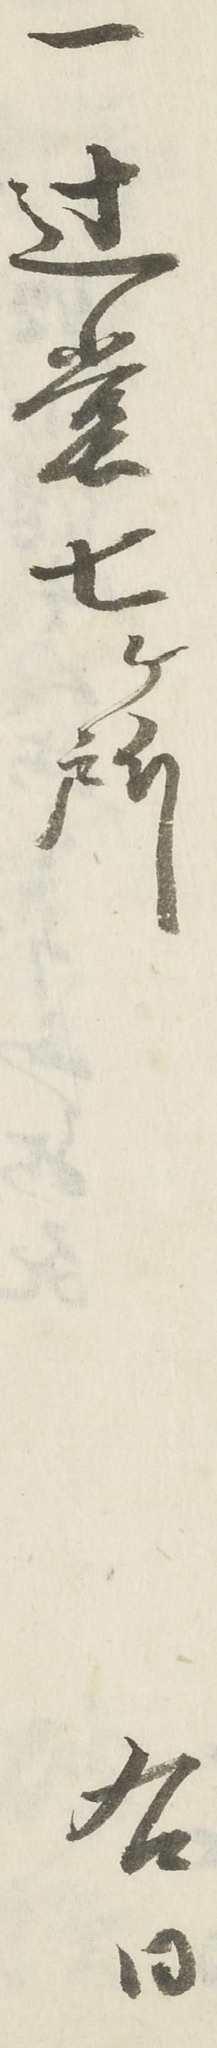一辻堂七ケ所右同
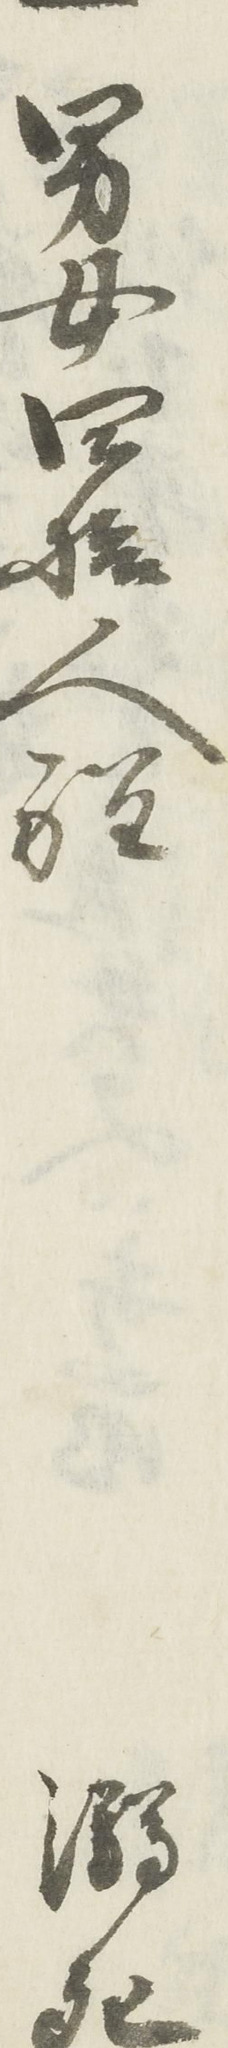一男女四拾人程溺死
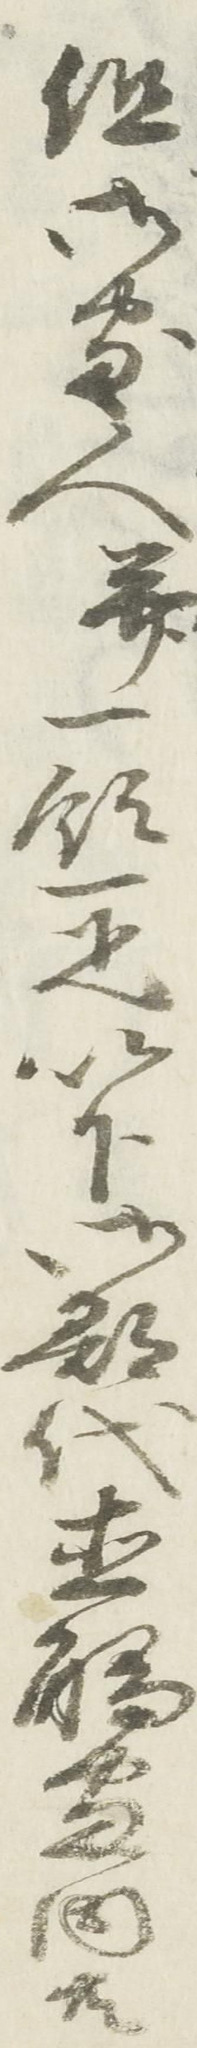但御家人并一領一疋以下御郡代直触家内共
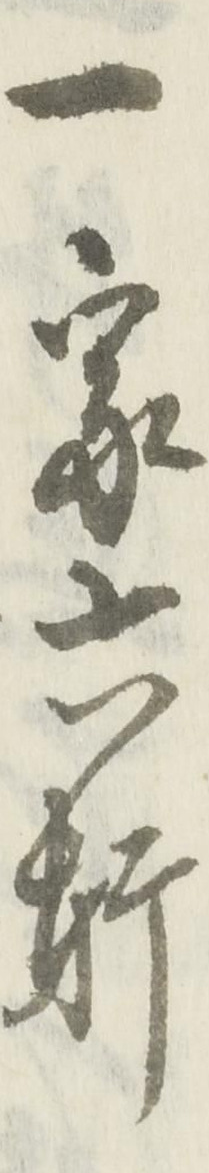一家六軒
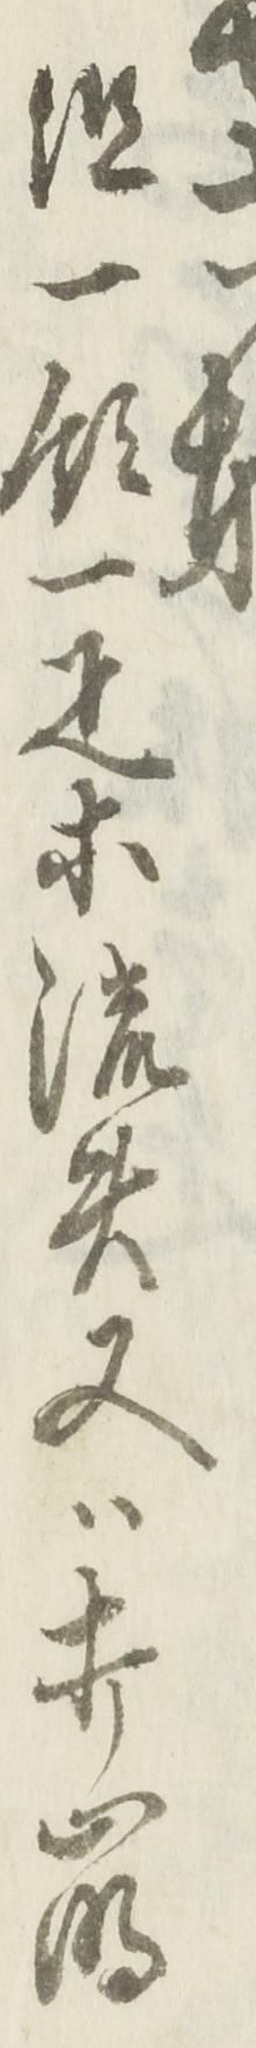但一領一疋等流失又ハ打崩
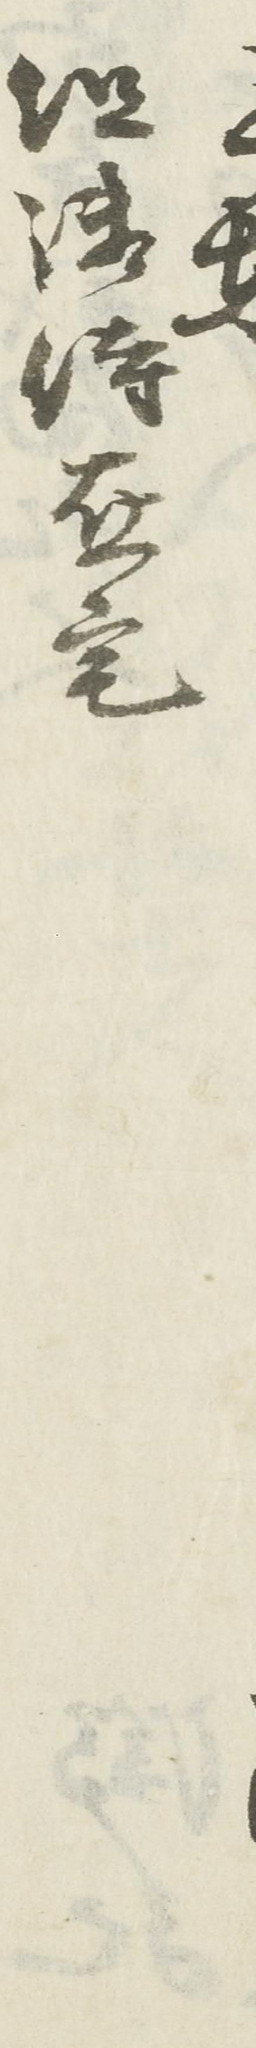但御侍在宅
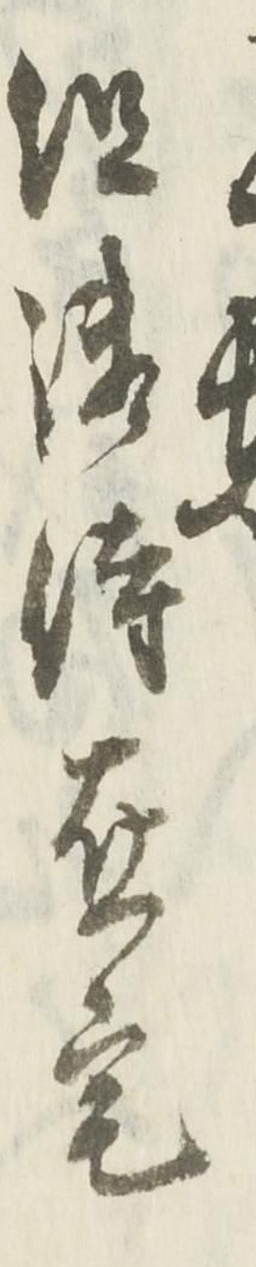但御侍在宅
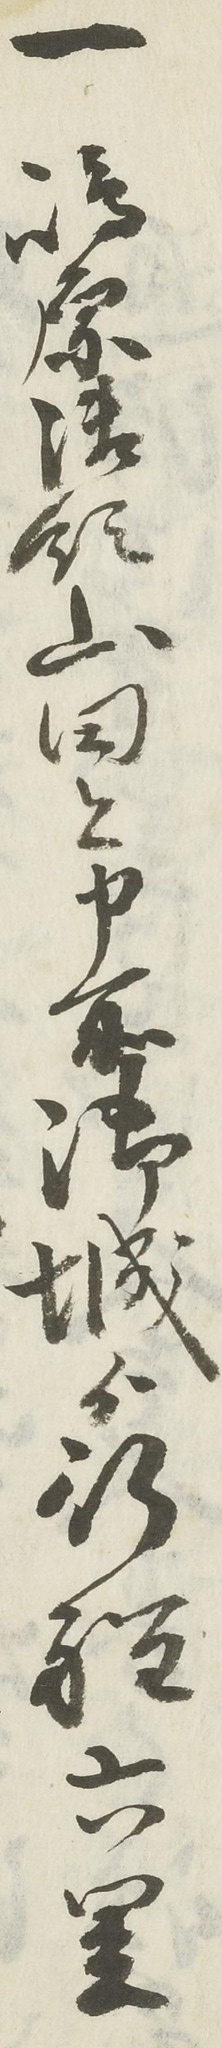一嶋原御領山田と申所御城ゟ行程六里
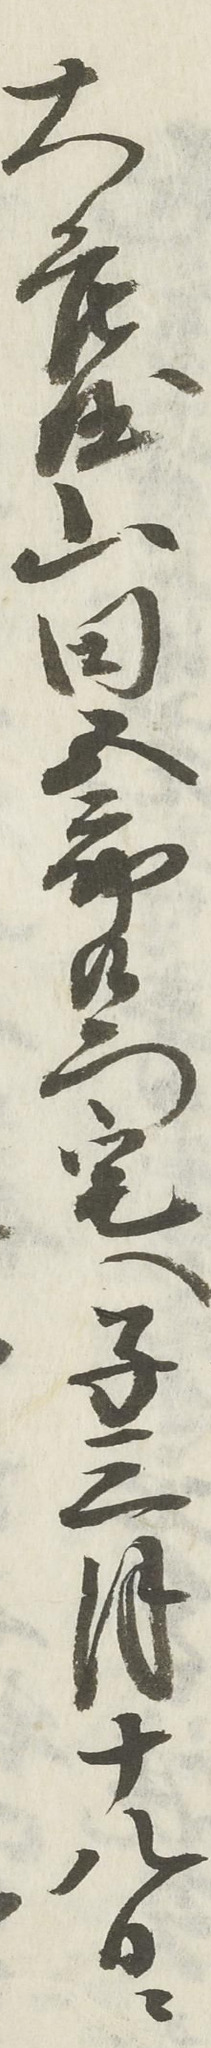大庄屋山田五郎左衛門宅へ子三月十八日ニ
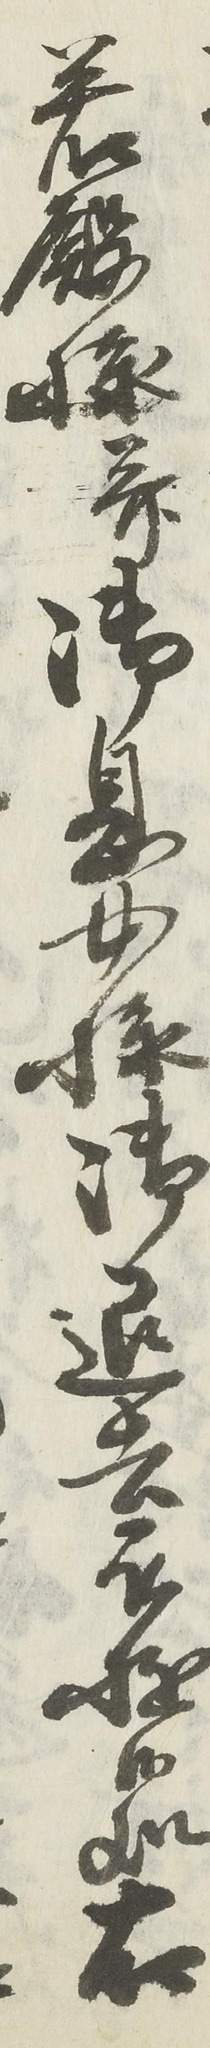若殿様并御息女様御退去被遊候処右
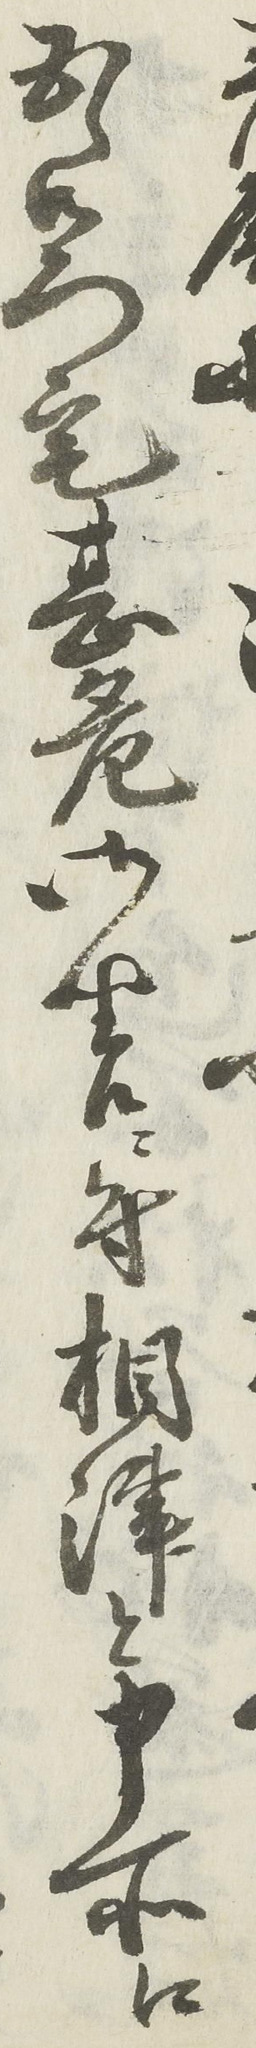五郎左衛門宅甚危御座候ニ付相津と申所江
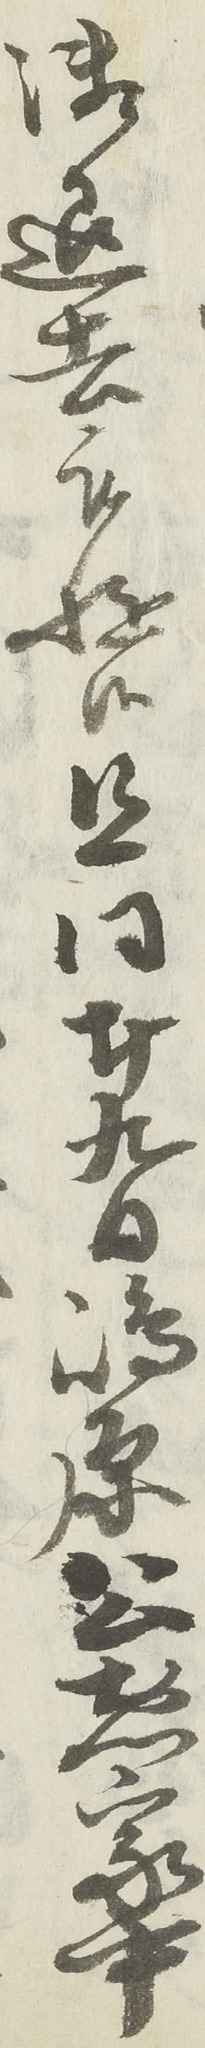御退去被遊候且同廿九日嶋原公惣家中
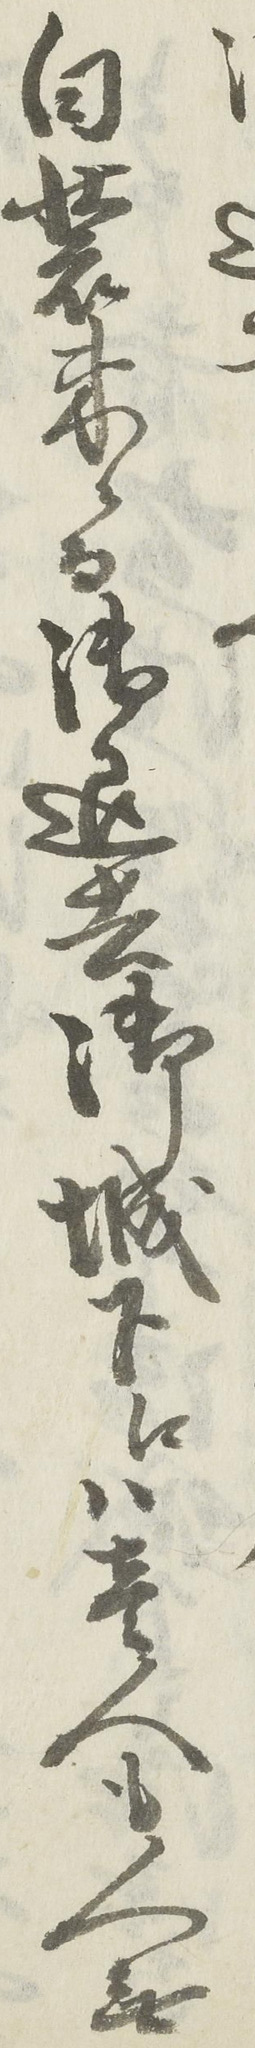白装束ニ而御退去御城下江は壱人も人無
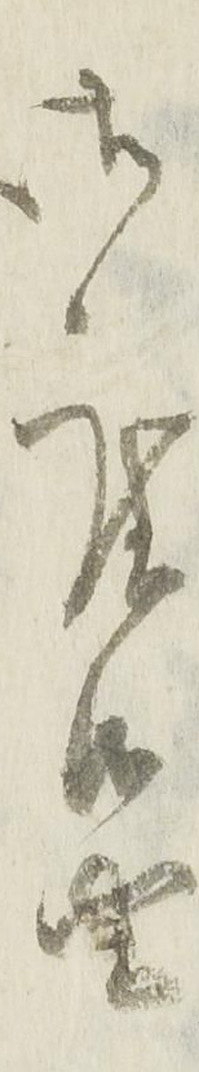御座候由
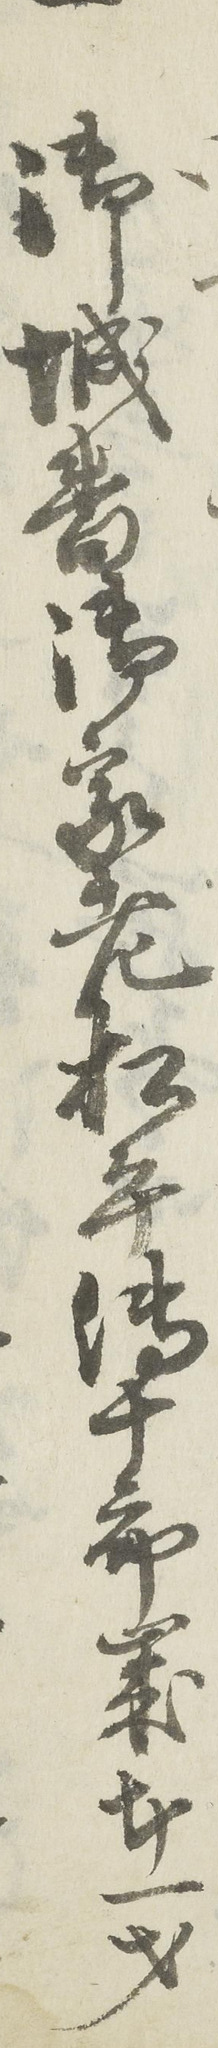一御城番御家老松平傳十郎歳廿一才
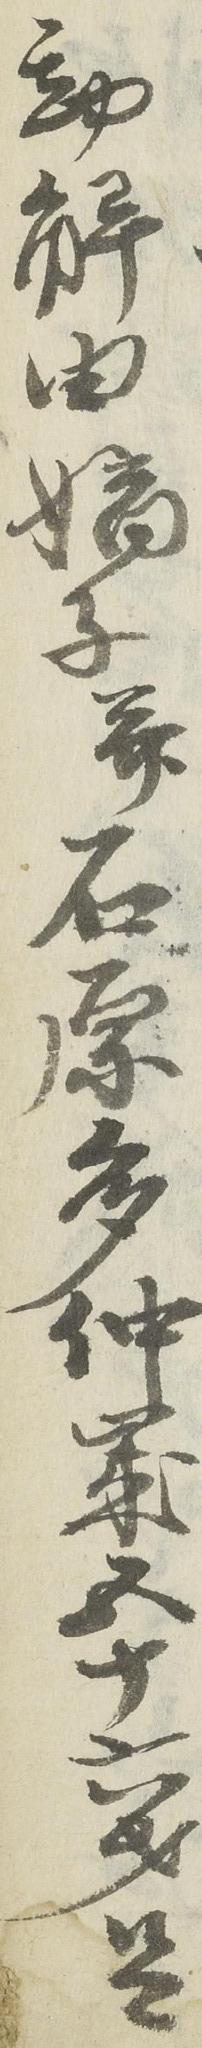勘解由嫡子并石原多仲歳五十六才足
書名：後見笑
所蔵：東京大学地震研究所図書室 Earthquake Research Institute Library, The University of Tokyo, JAPAN
